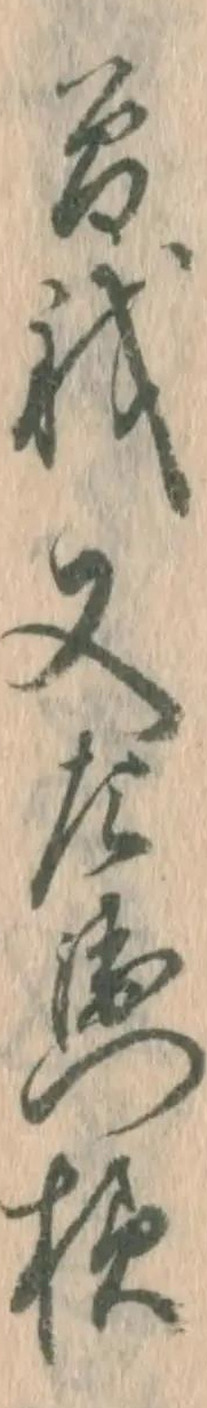曽我又左衛門様
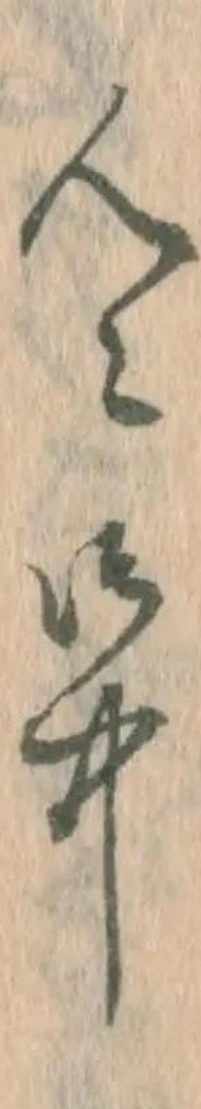人々御中
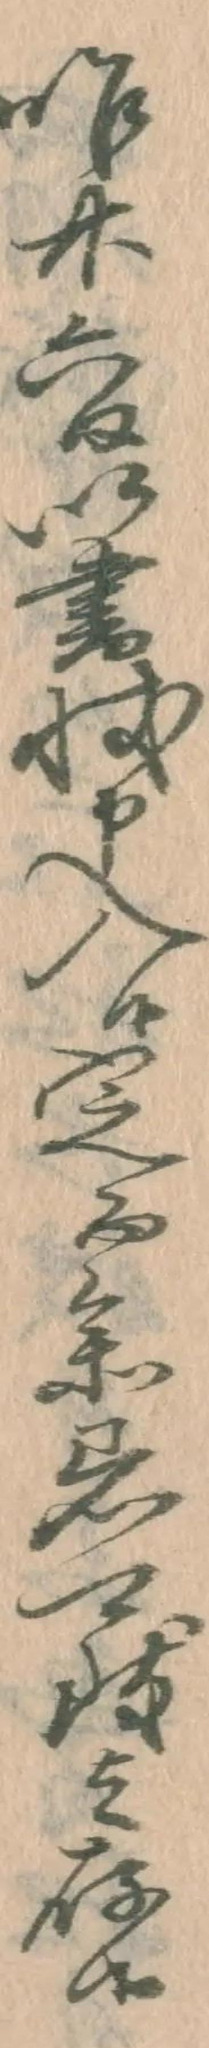昨廿六日以書状申入候定而参着可致与存候
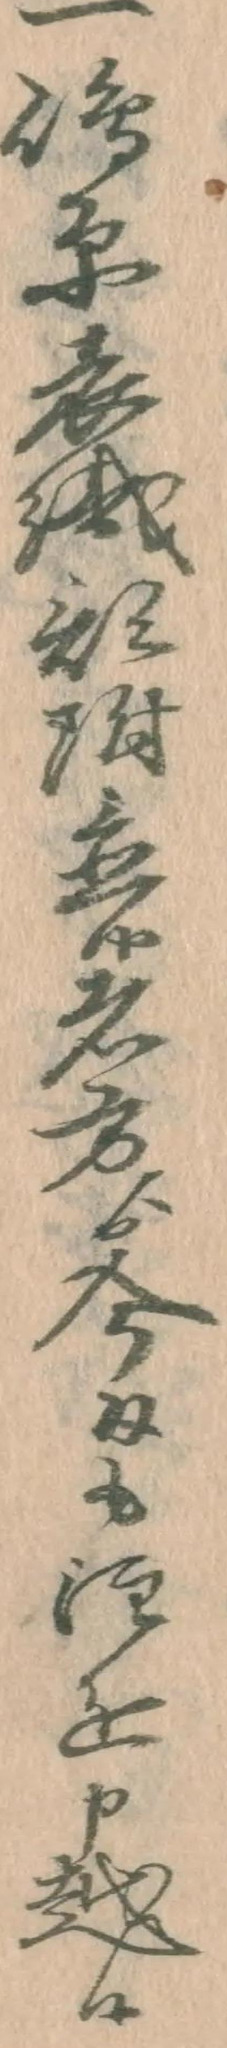一島原表織部附置候者方ゟ今日も注進申越候
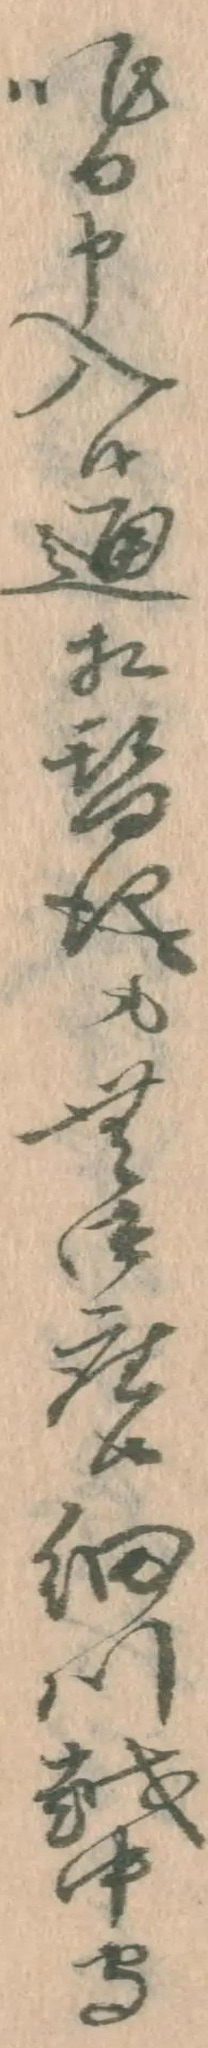昨日申入候通相替儀も無御座候細川越中守
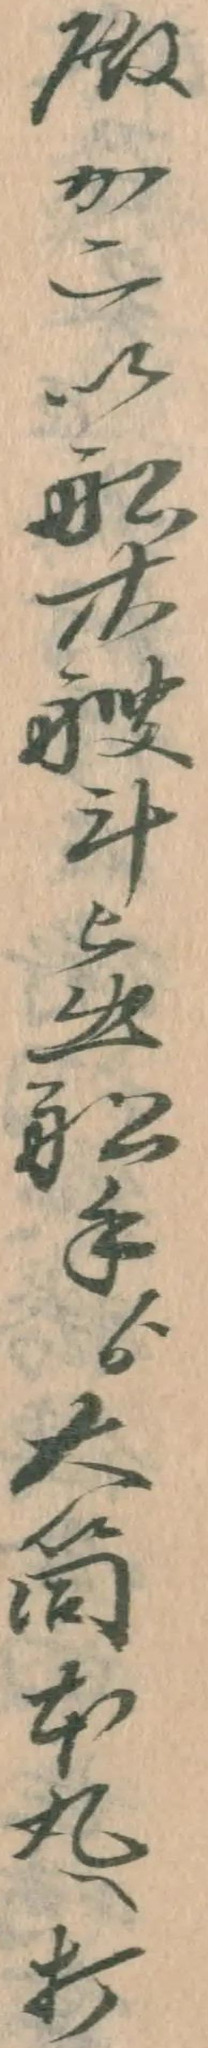殿かこ以舩廿艘斗被出舩手ゟ大筒本丸へ打
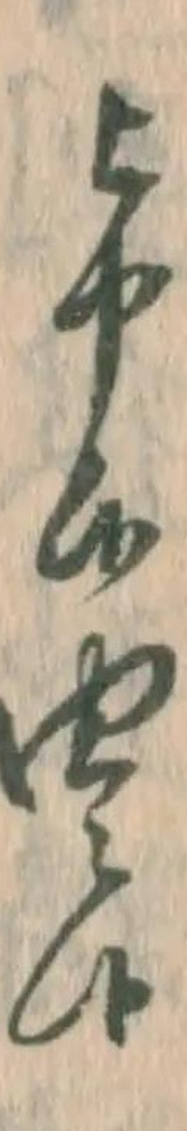被申候由に候
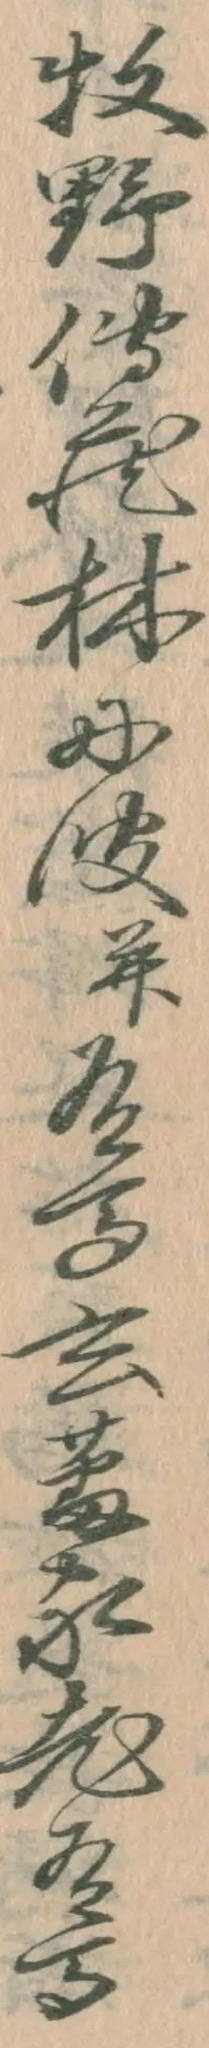一牧野伝蔵林丹波幷有馬玄蕃家老有馬
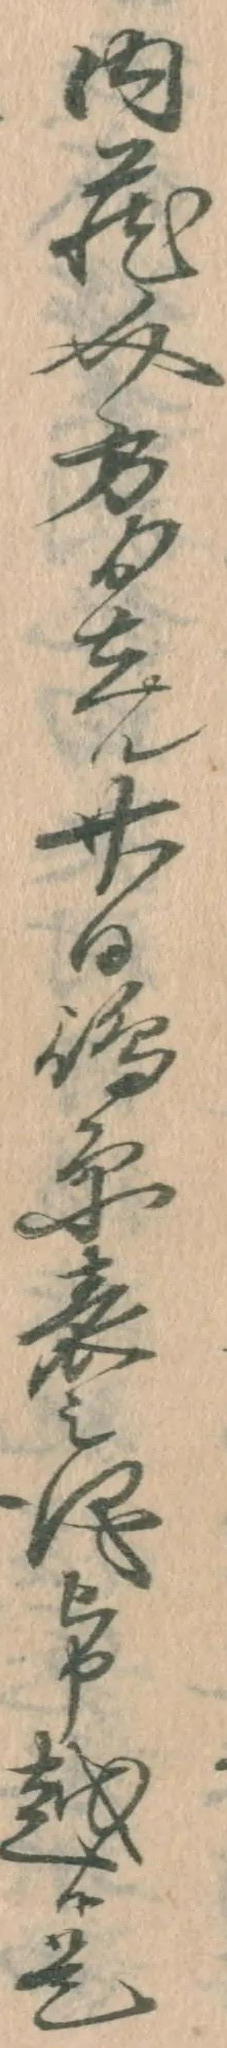内蔵介方ゟ去る廿日島原表之儀被申越候是
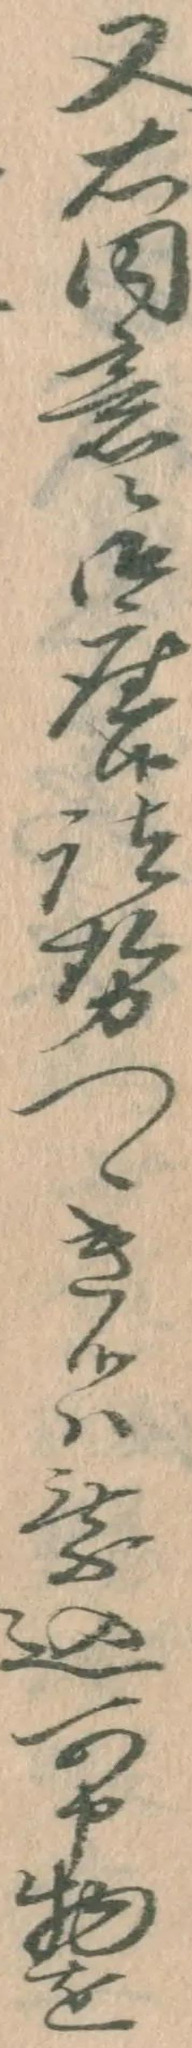又右同意に御座候諸勢つゝき候は乗込可申物を
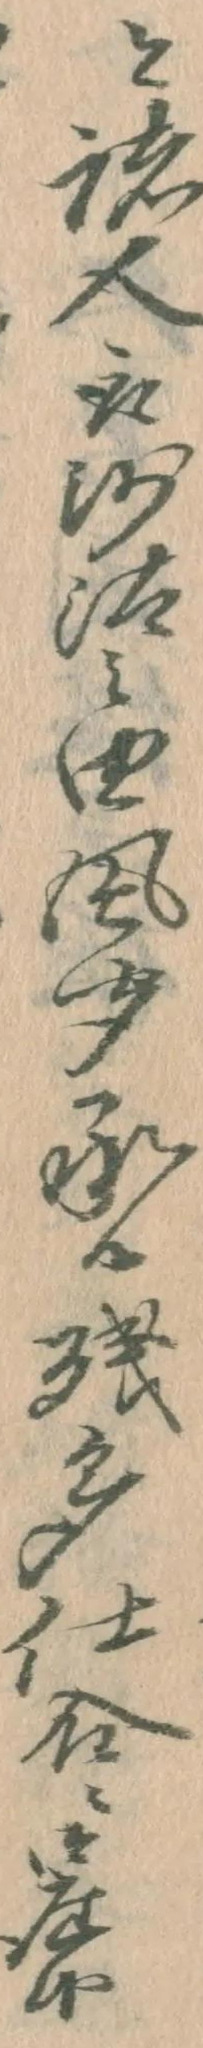と諸人取沙汰之由風聞承候残多仕合に御座候
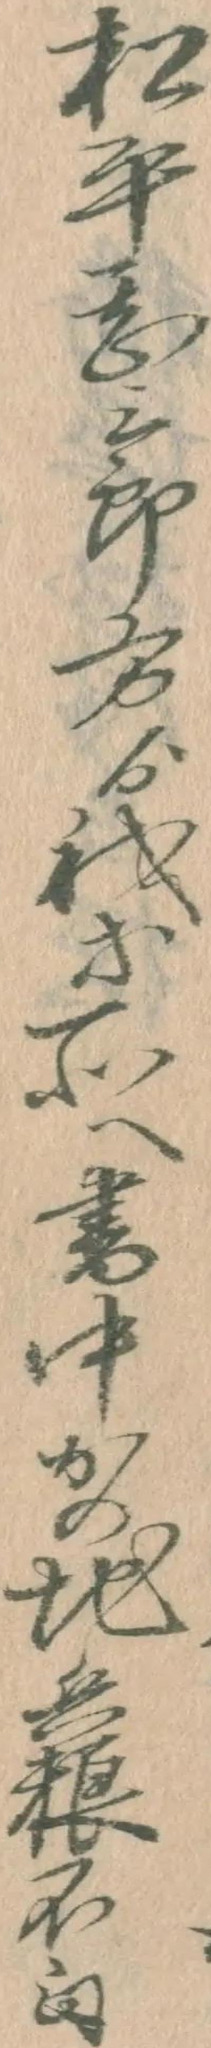一松平甚三郎方ゟ我等所へ書中かの地兵粮不自
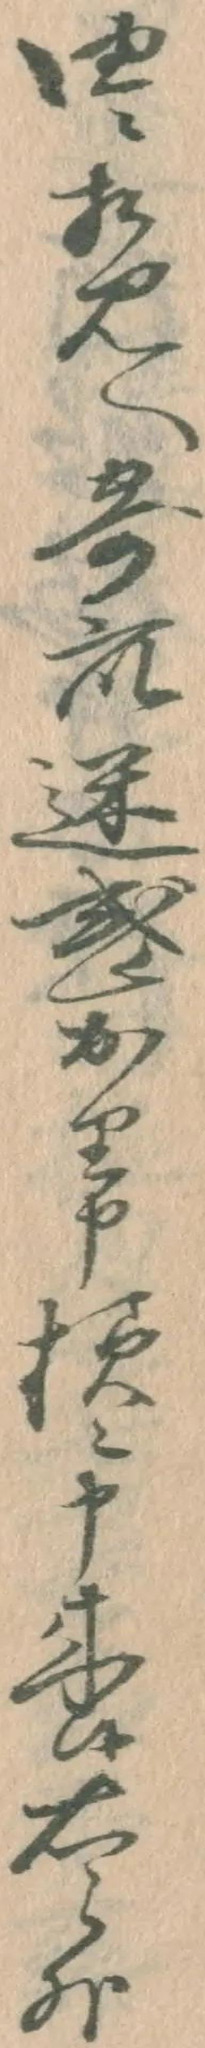由に相見へ寄衆迷惑か里申様に申来る候右之外
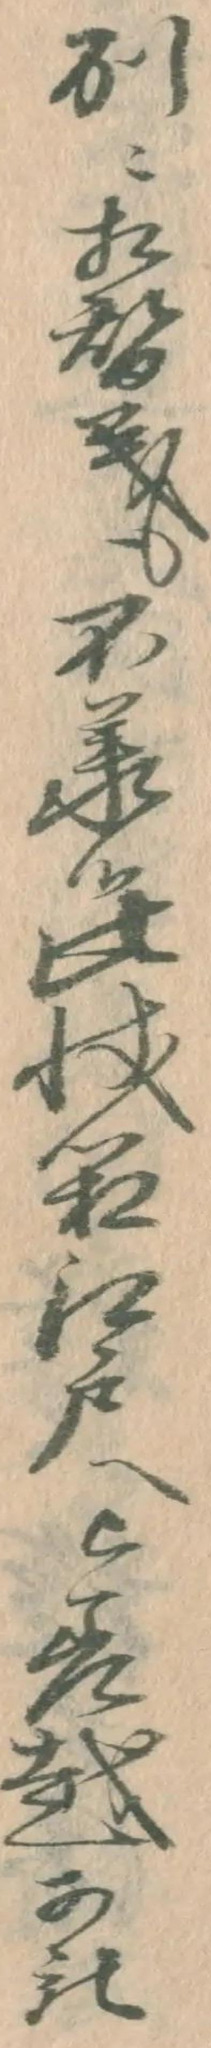別に相替義も不承候此状箱江戸へ被差越可被

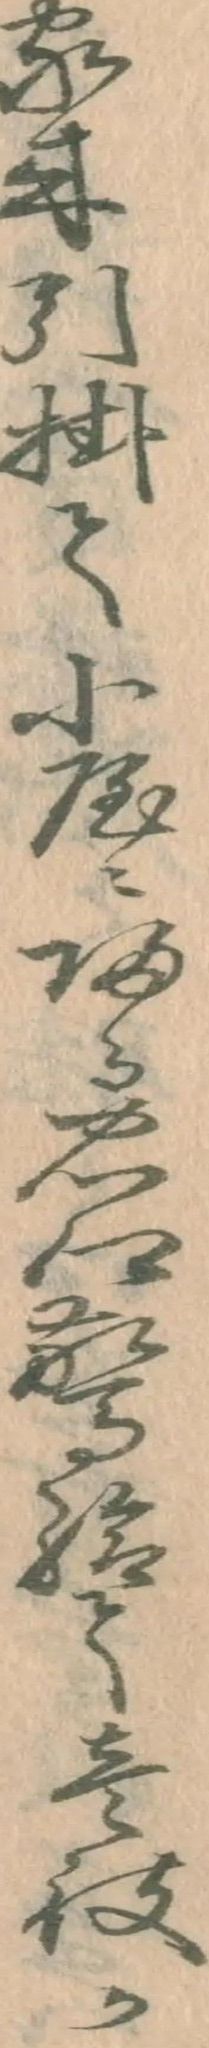家来引掛て小屋に帰る忠郷驚給て壱岐か
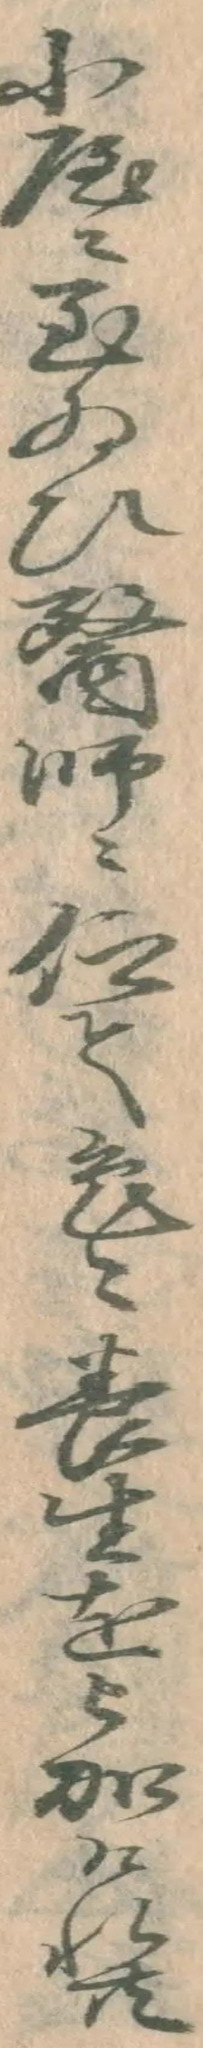小屋に至居ゐひ医師に仰て兎に養生を被加けれ共
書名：切支丹御退治記 49巻. [5]
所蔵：国立国会図書館 National Diet Library, JAPAN
